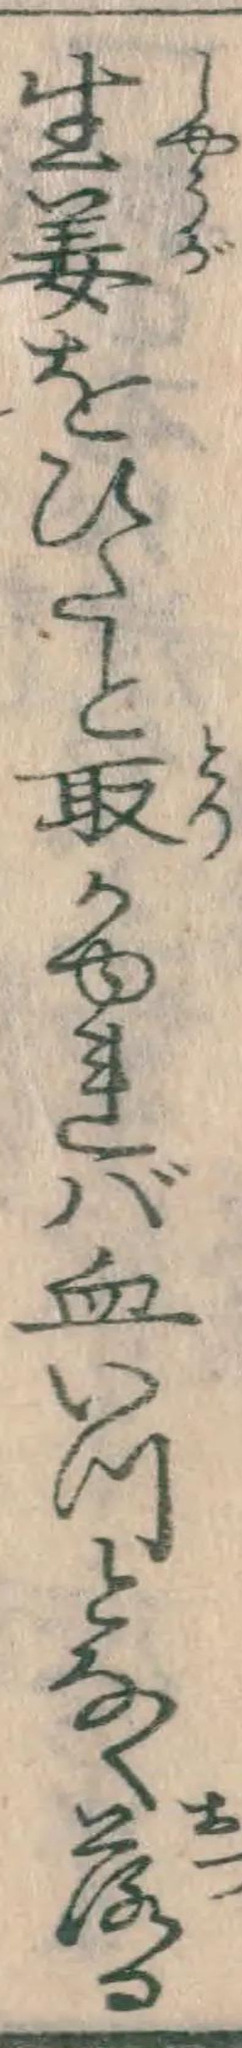生姜をひたと取かゆれば血いつとなく落る
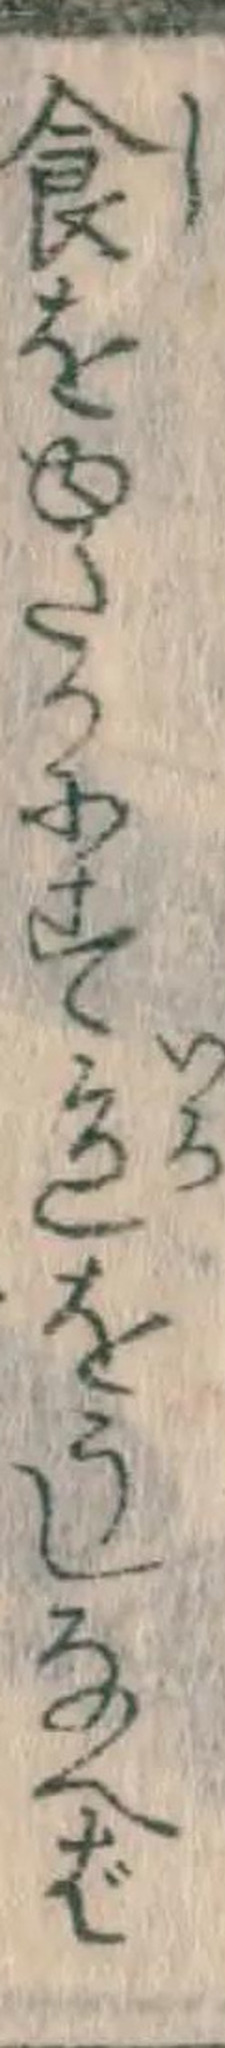食をゆたかにす色をうしなへば
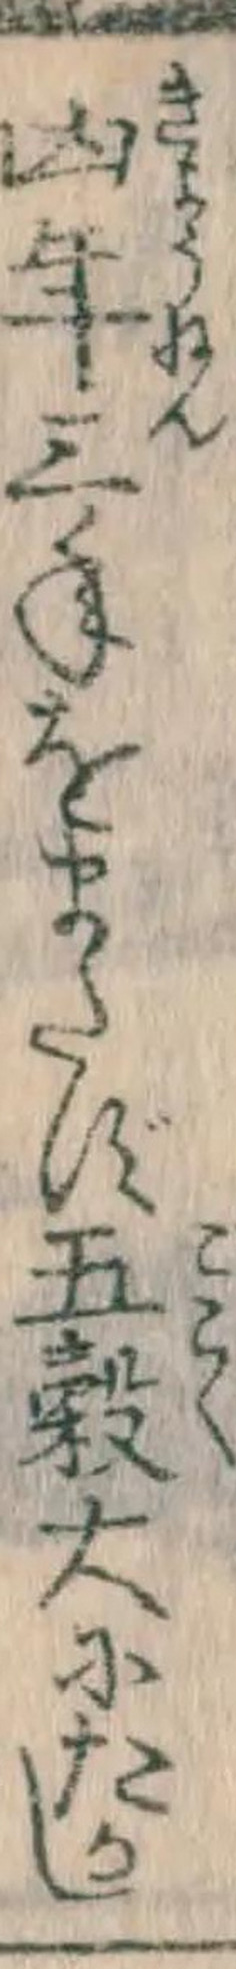凶年三年をまたず五穀大にたかし
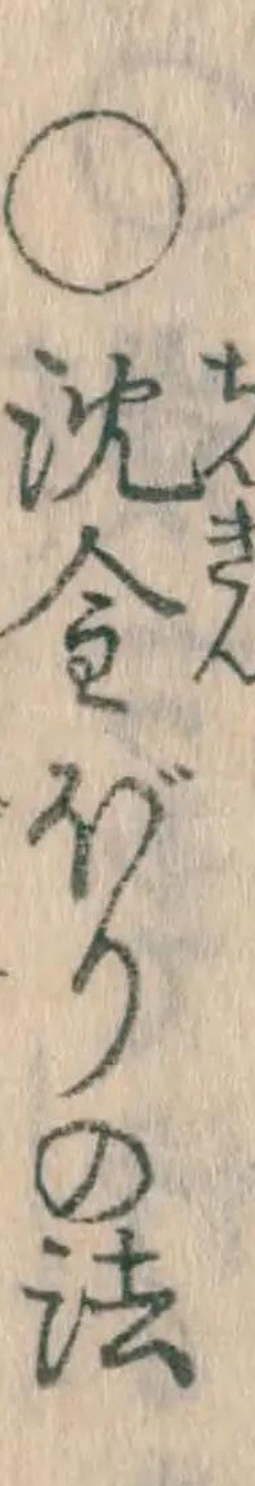○沈金ぼりの法
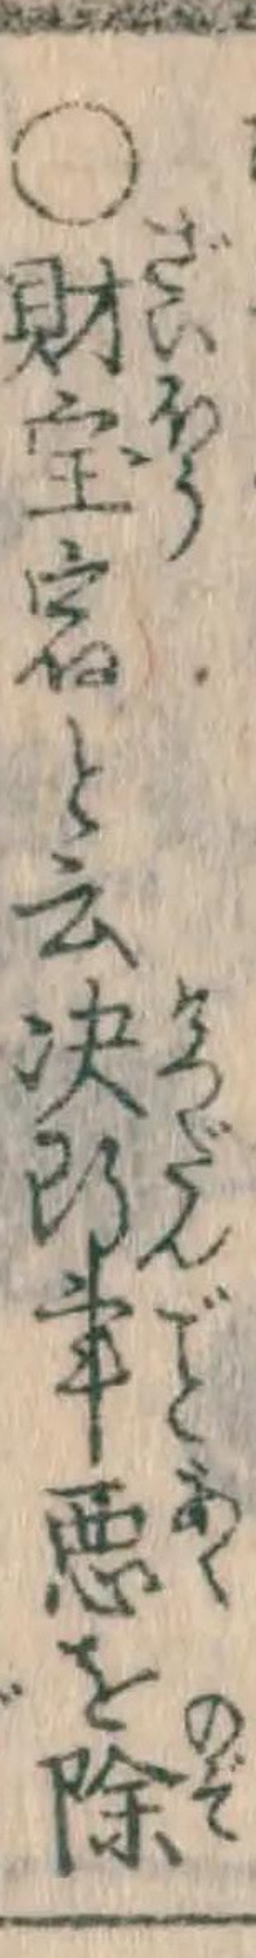○財宝宿と云決断事悪を除
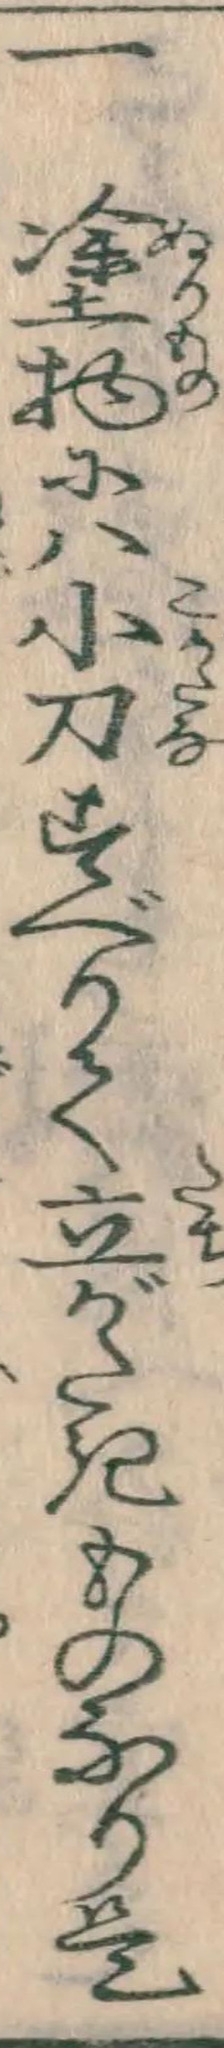一塗物には小刀すべりて立がたきものなり是
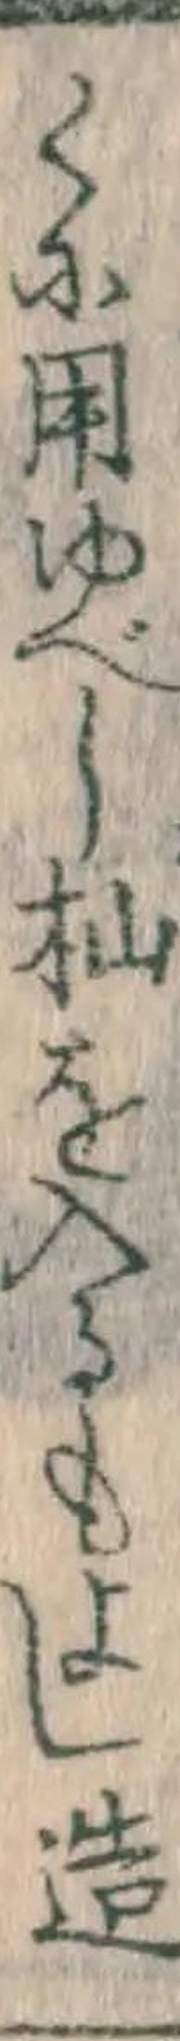くに用ゆべし杣を入るもよし造
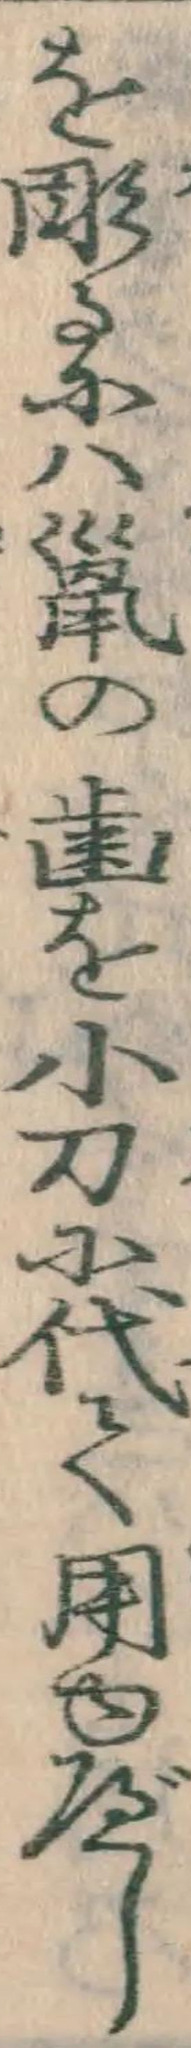を彫るには鼠の歯を小刀に代て用ゆべし
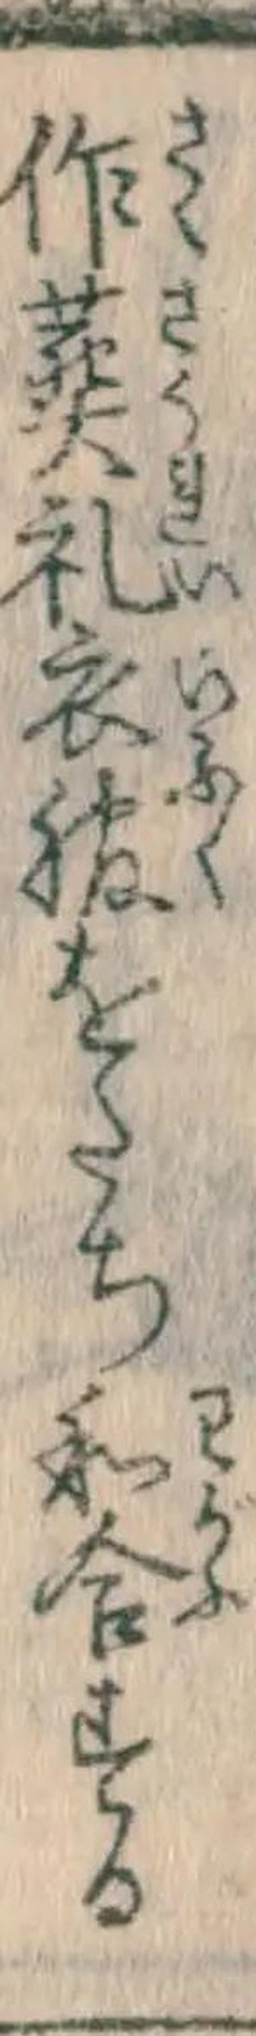作葬礼衣服をたち和合する
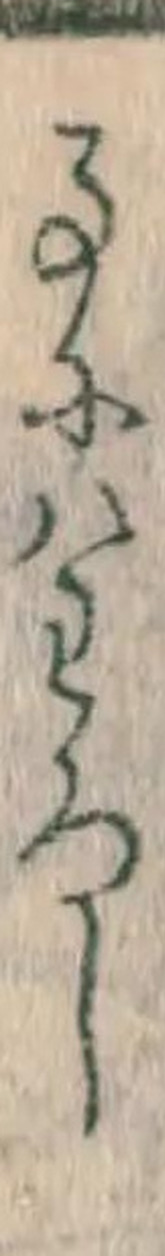事にはわろし
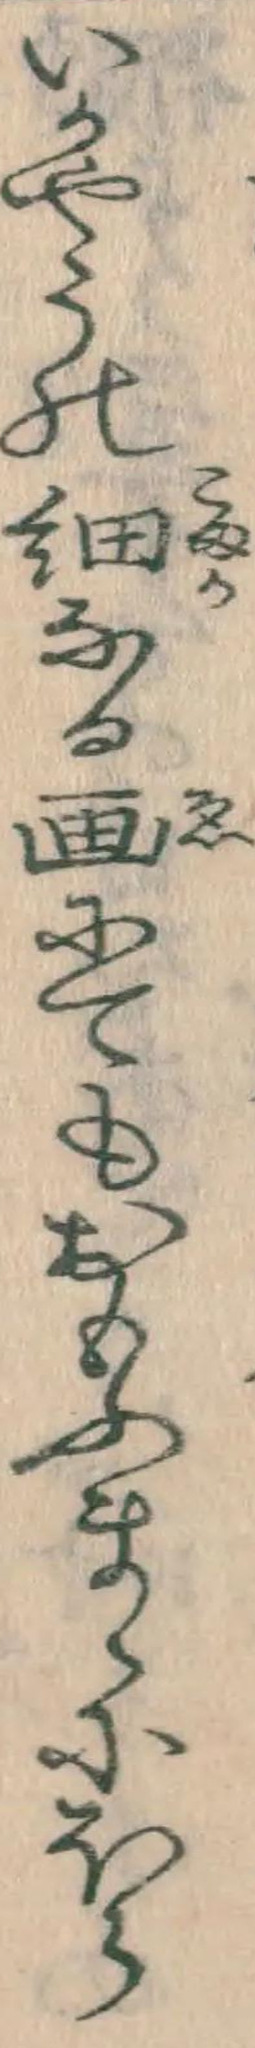いかやうの細なる画にてもおもふまゝにほら
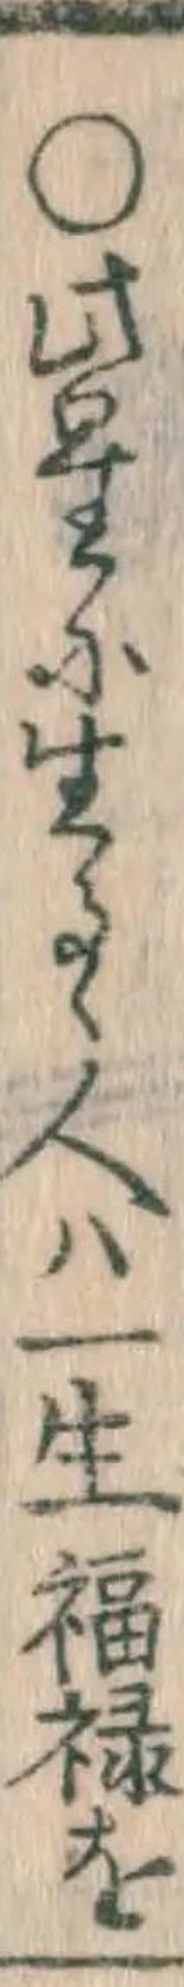○此星に生るゝ人は一生福禄を
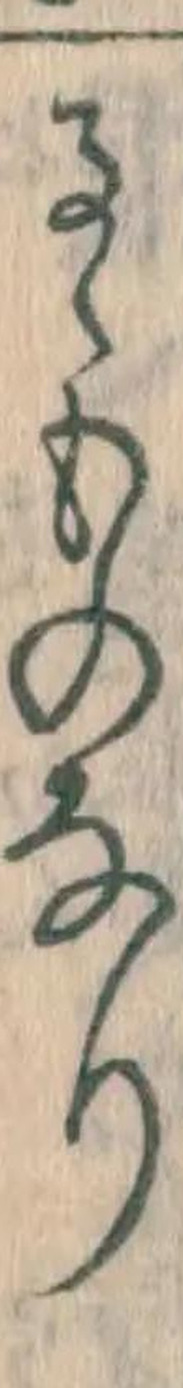るゝものなり
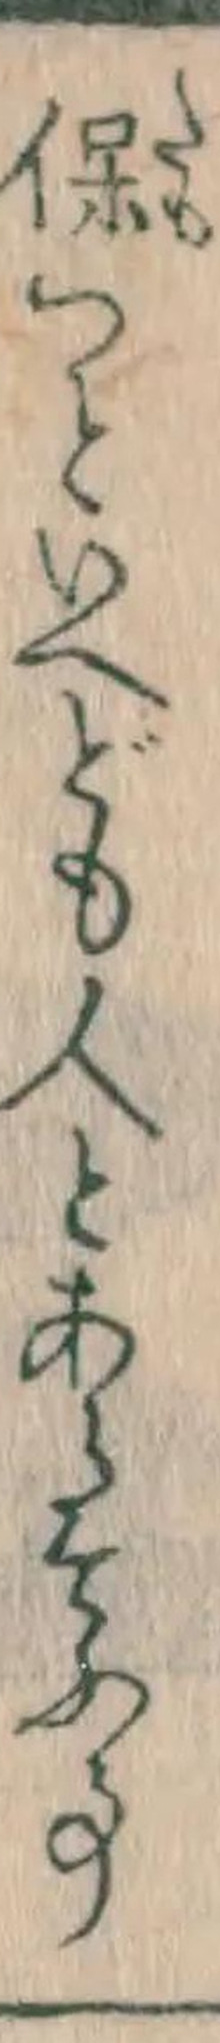保つといへども人とあらそふ事
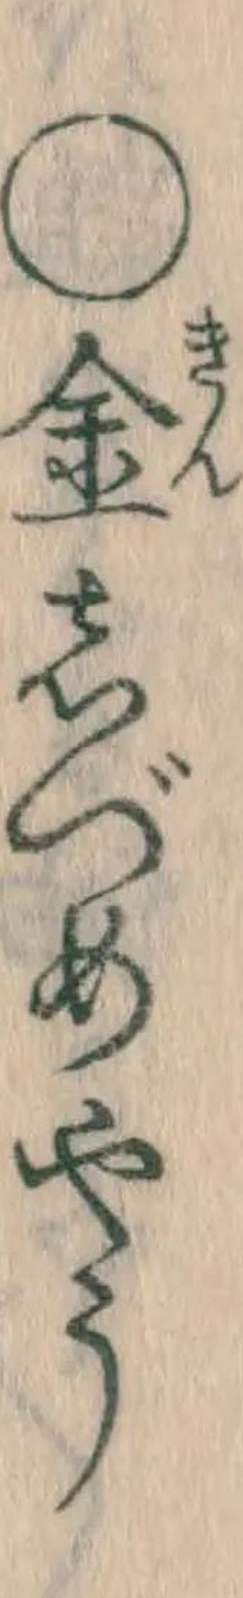○金しづめやう
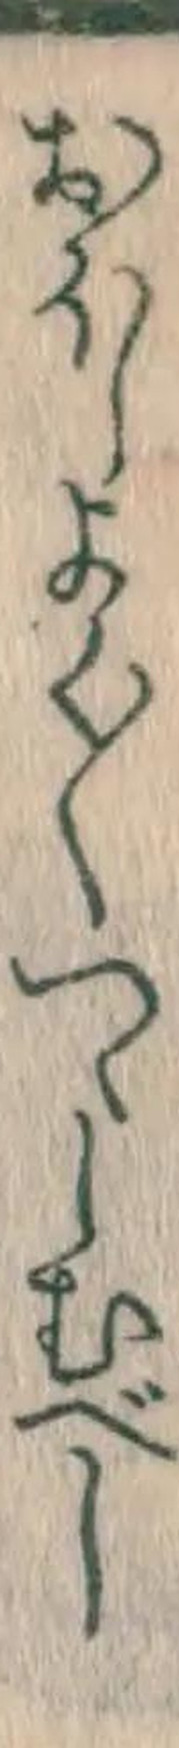おほしよく〳〵つゝしむべし
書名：広益秘事大全 3巻. [2]
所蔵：国立国会図書館 National Diet Library, JAPAN
